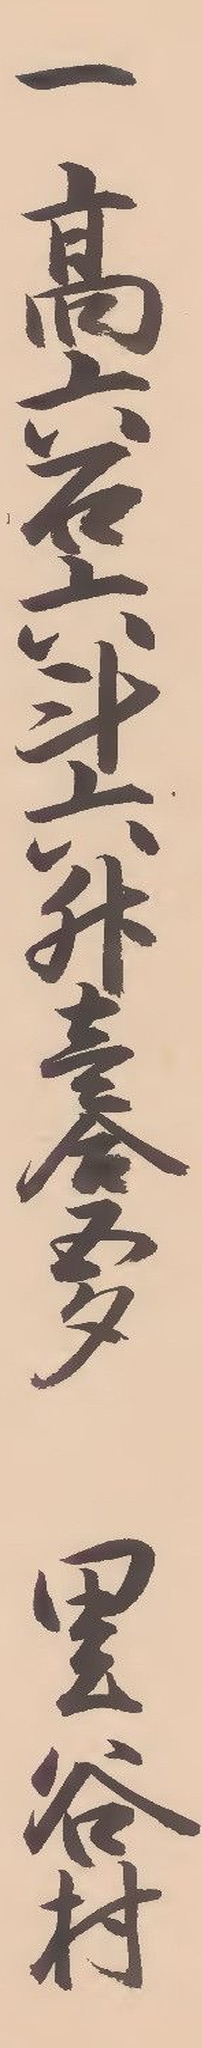一高六石六斗六升壱合五勺里谷村
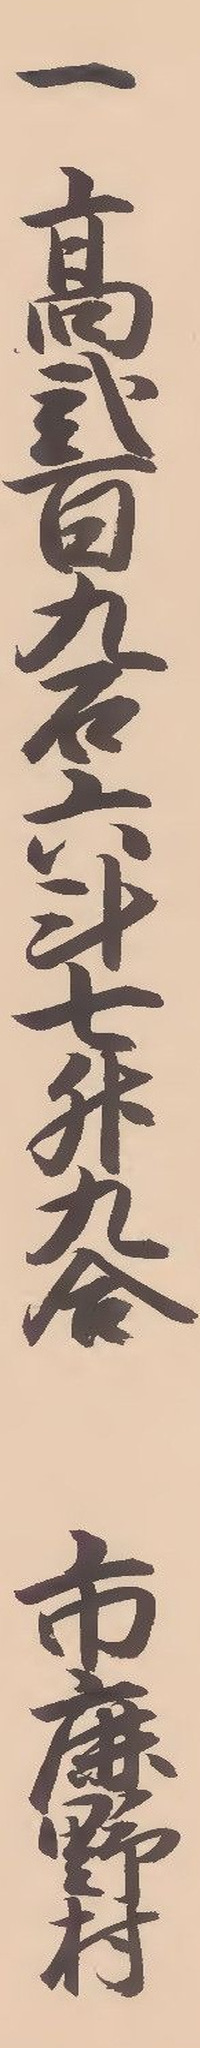一高弐百九石六斗七升九合市鹿野村
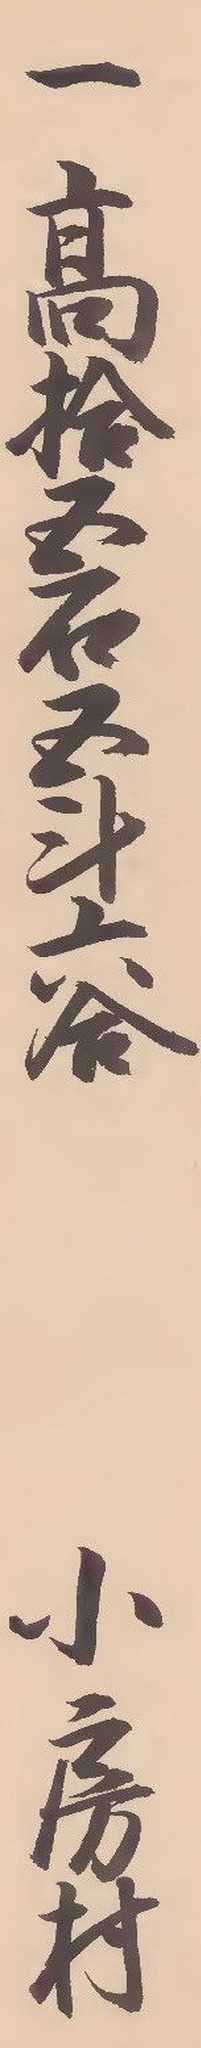一高拾五石五斗六合小房村

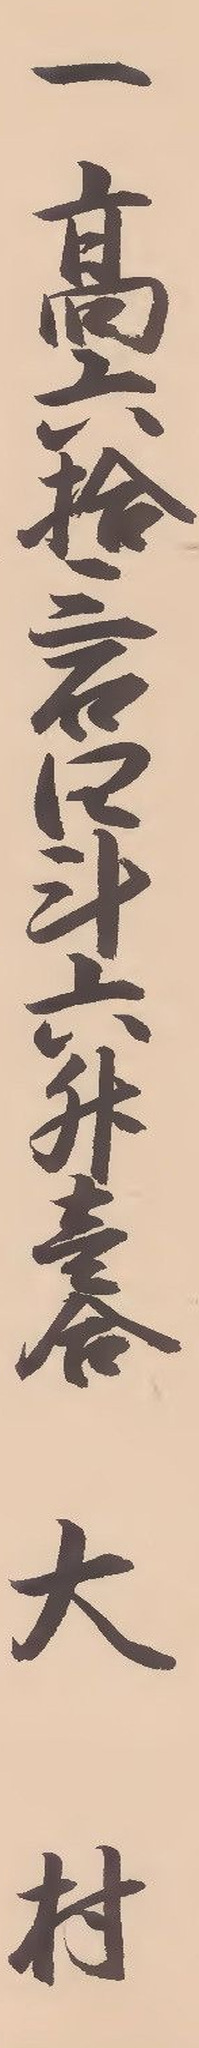一高六拾三石四斗六升壱合大村
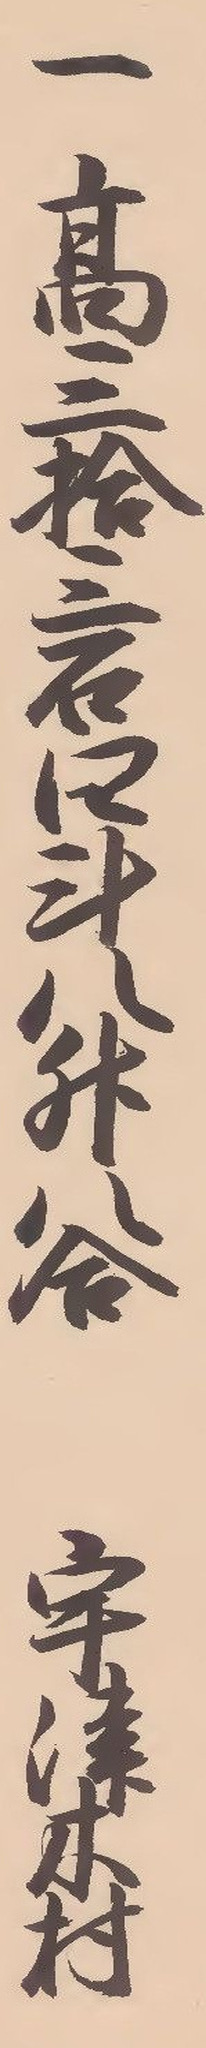一高三拾三石四斗八升八合宇津木村
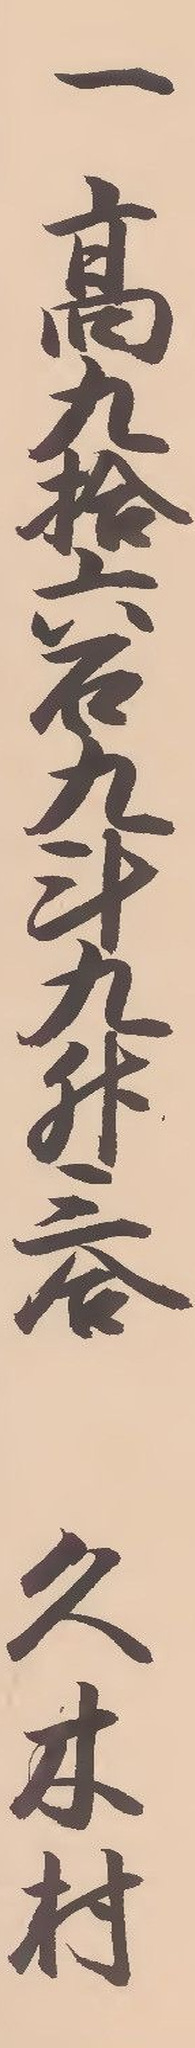一高九拾六石九斗九升三合久木村
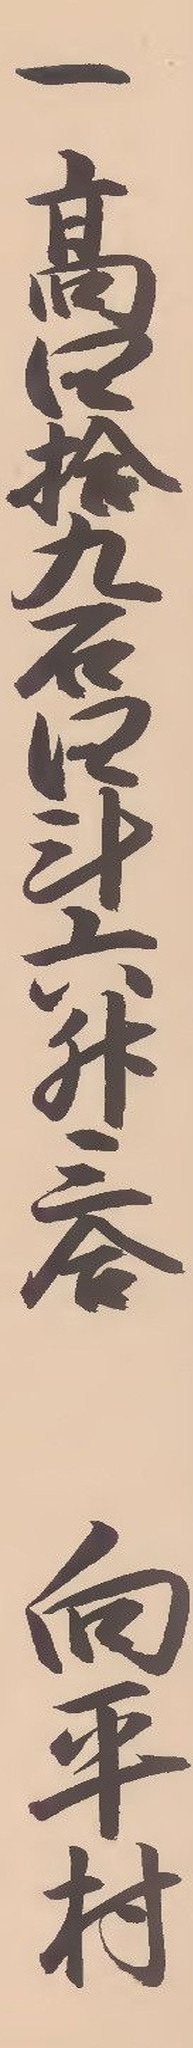一高四拾九石四斗六升三合向平村
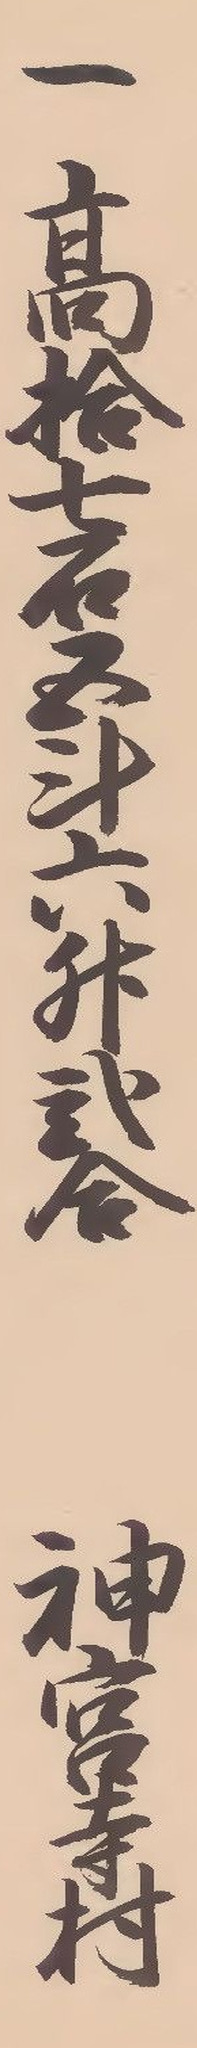一高拾七石五斗六升弐合神宮寺村
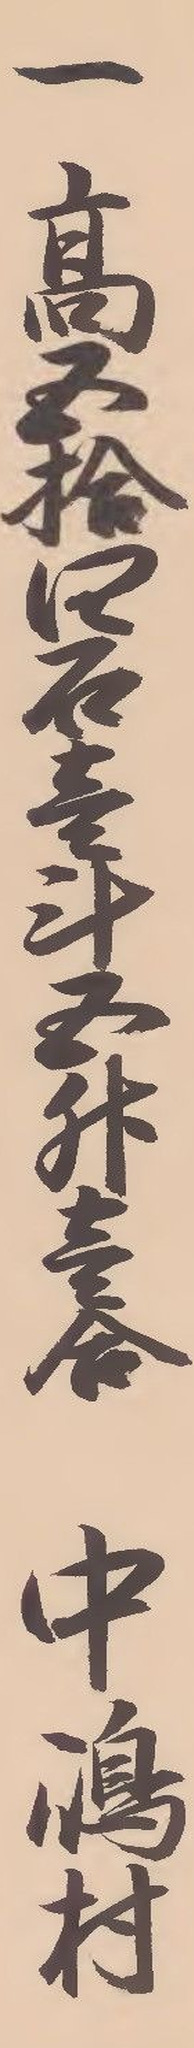一高五拾四石壱斗五升壱合中島村
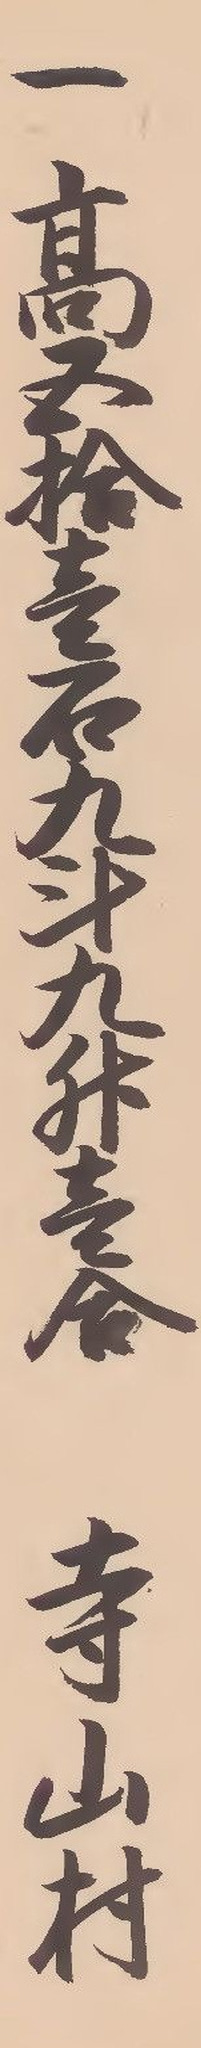一高五拾壱石九斗九升壱合寺山村

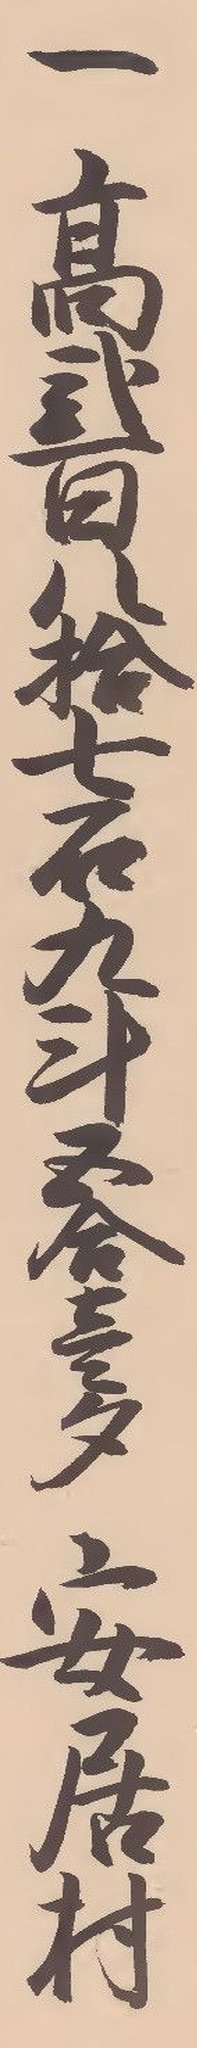一高弐百八拾七石九斗五合壱勺安居村
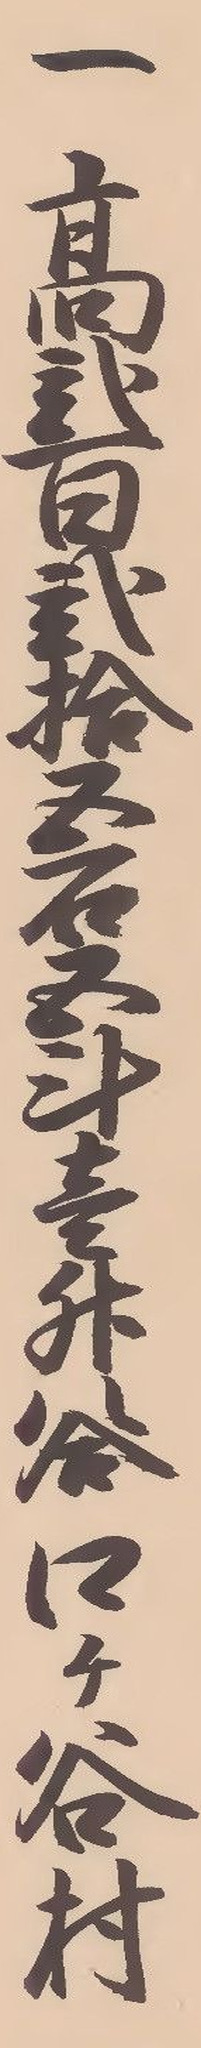一高弐百弐拾五石五斗壱升八合口ヶ谷村
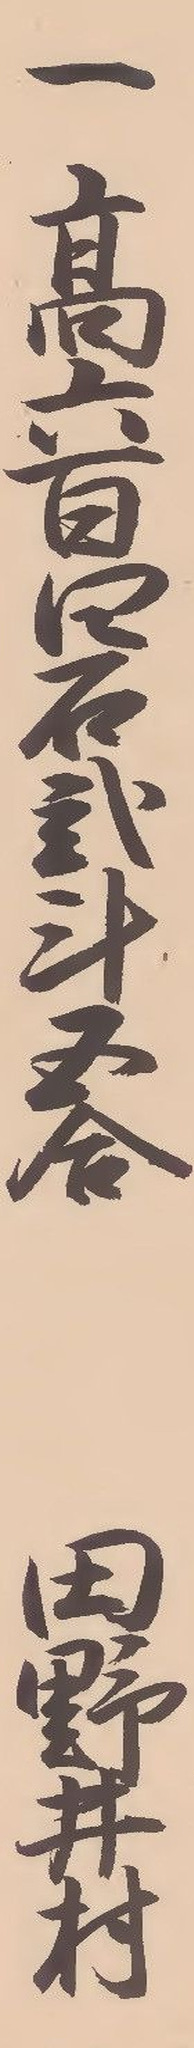一高六百四石弐斗五合田野井村
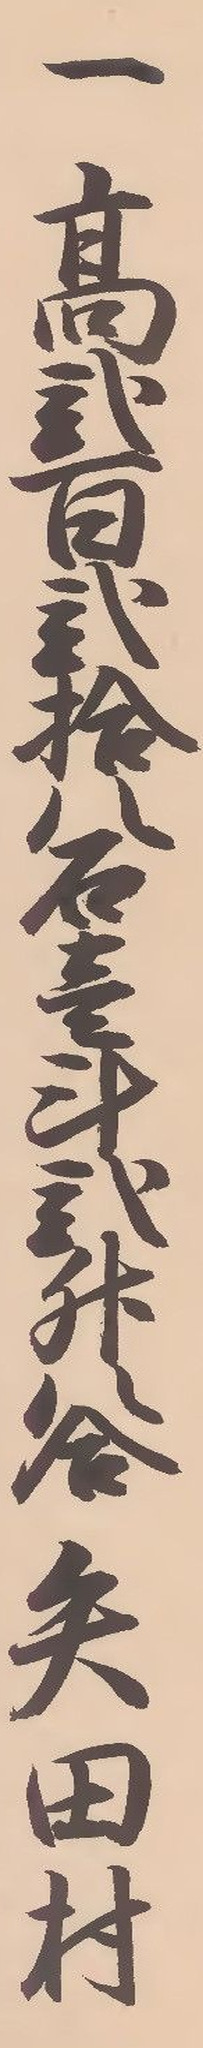一高弐百弐拾八石壱斗弐升八合矢田村
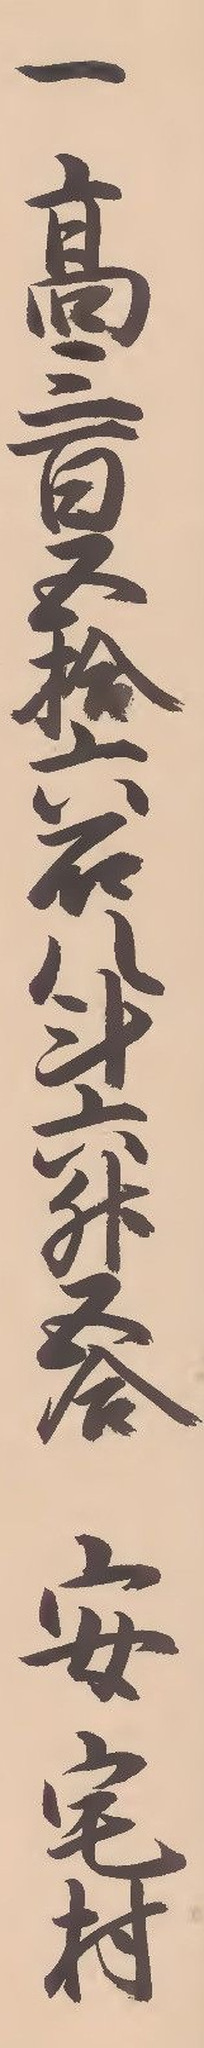一高三百五拾六石八斗六升五合安宅村
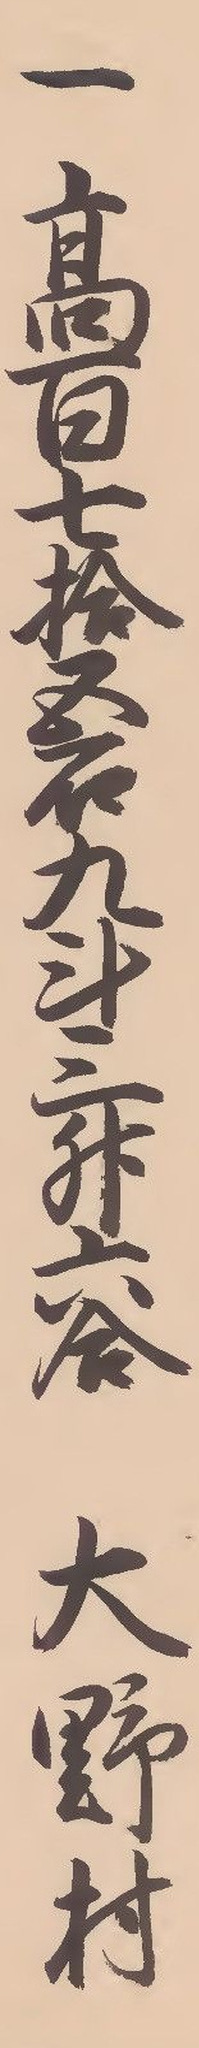一高百七拾五石九斗三升六合大野村
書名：紀伊国郷帳
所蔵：国立公文書館 National Archives of Japan
